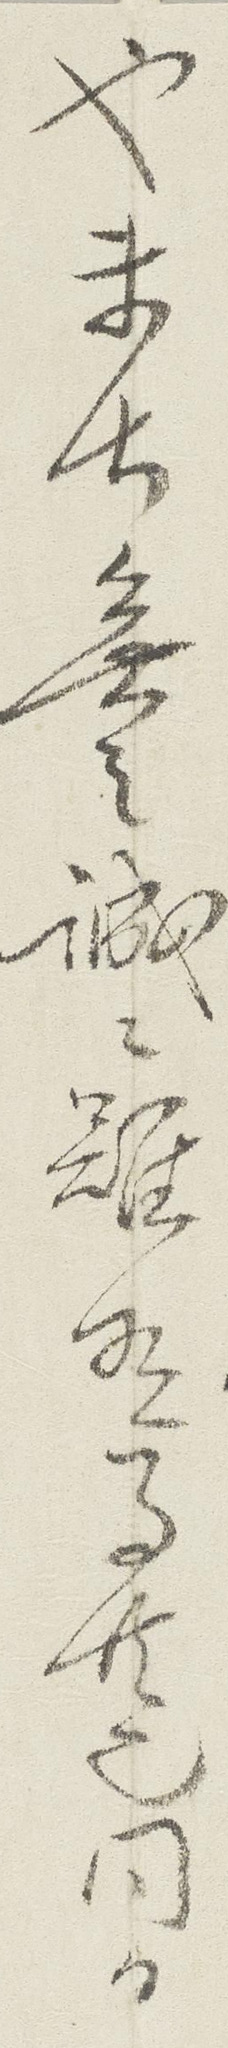やまち無之誠ニ難有事共也同日
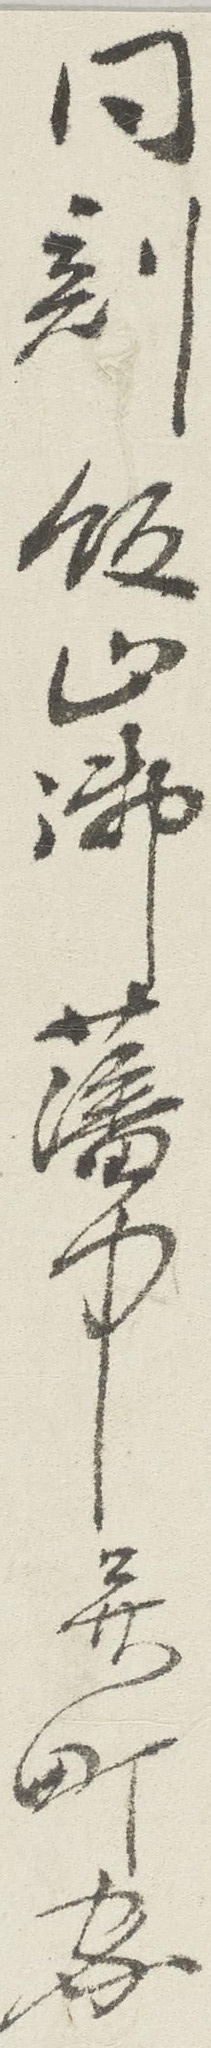同刻飯山御藩中幷町家
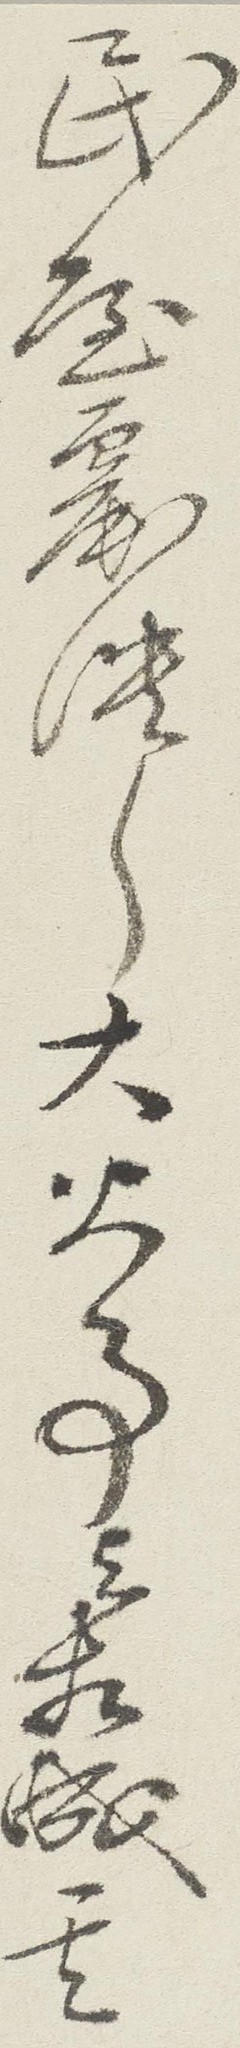民屋震潰候大火事と相成其
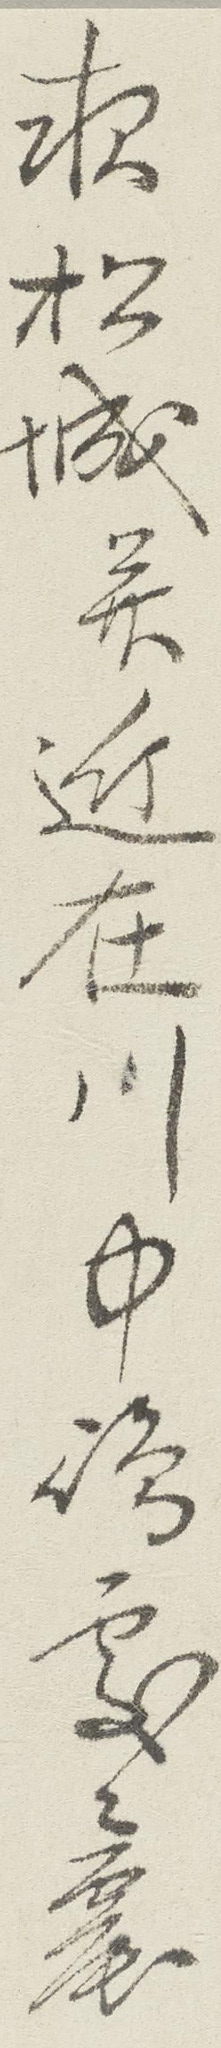夜松城幷近在川中嶋処ニ震
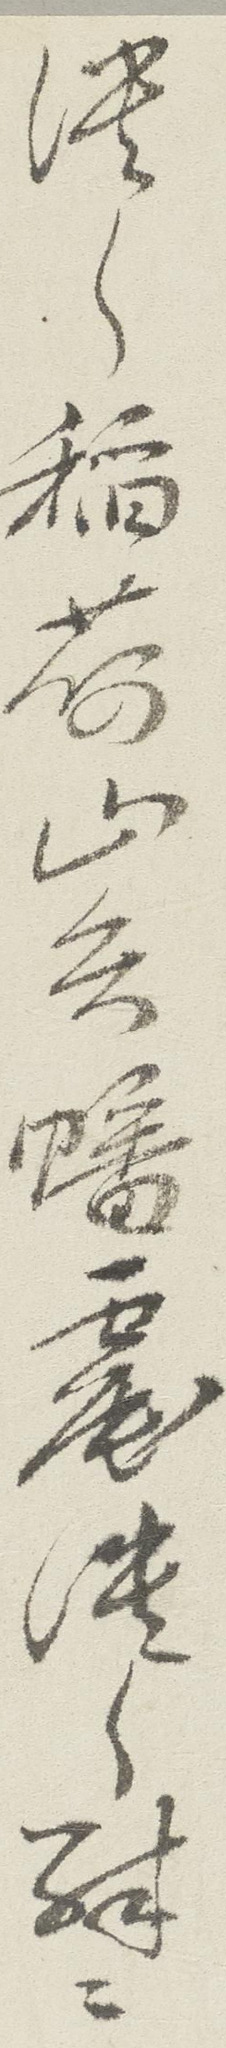潰候稲荷山矢幡震潰候殊ニ
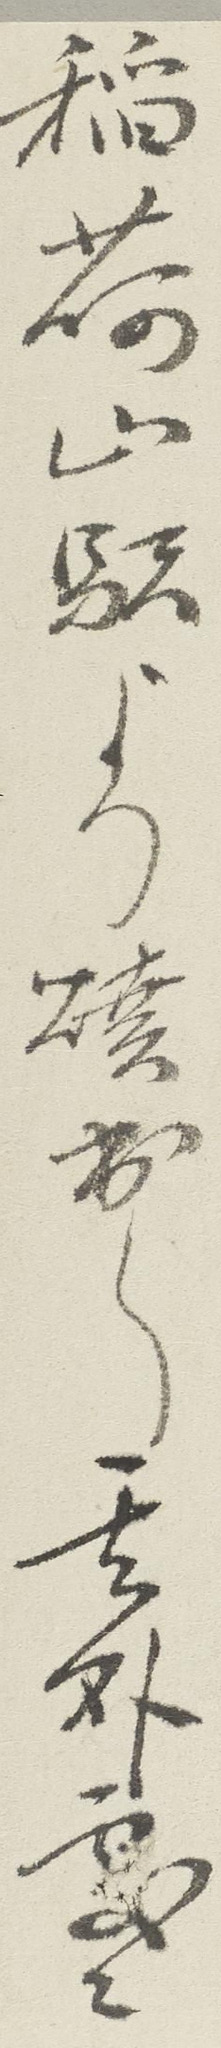稲荷山駅より焼出候其外処ニ
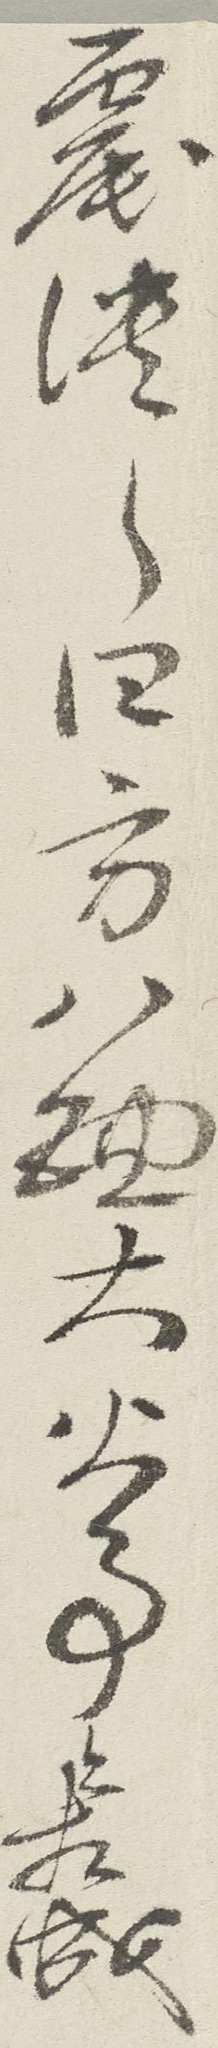震潰候四方は惣大火事と相成
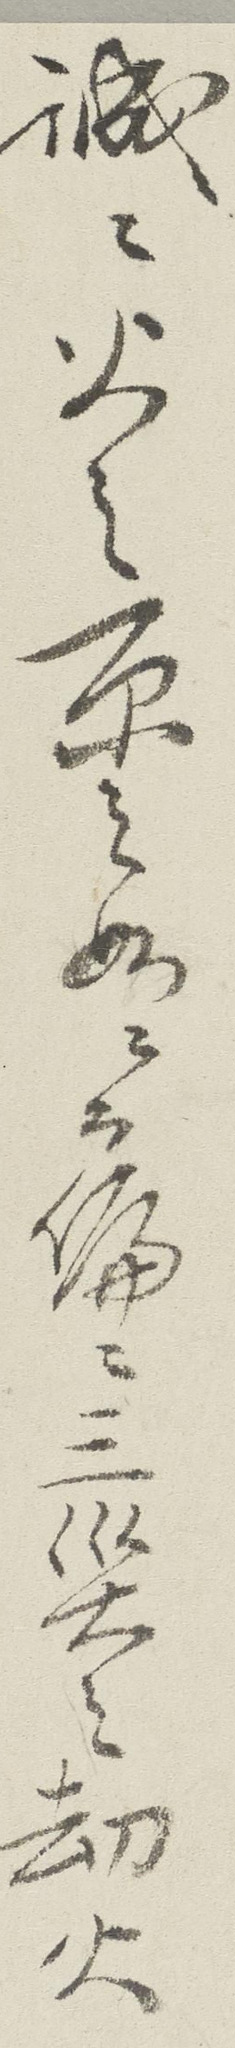誠ニ火之原之如二而偏ニ三災之劫火
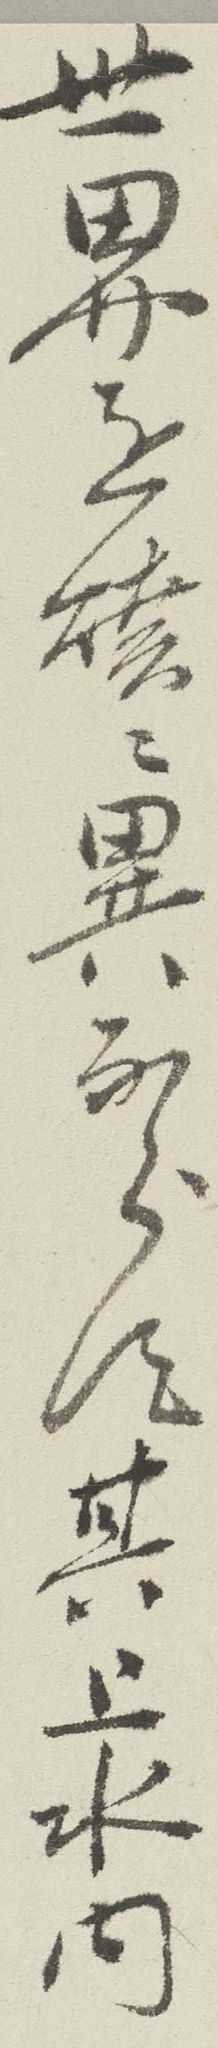世界を焼ニ異ならす其上水内
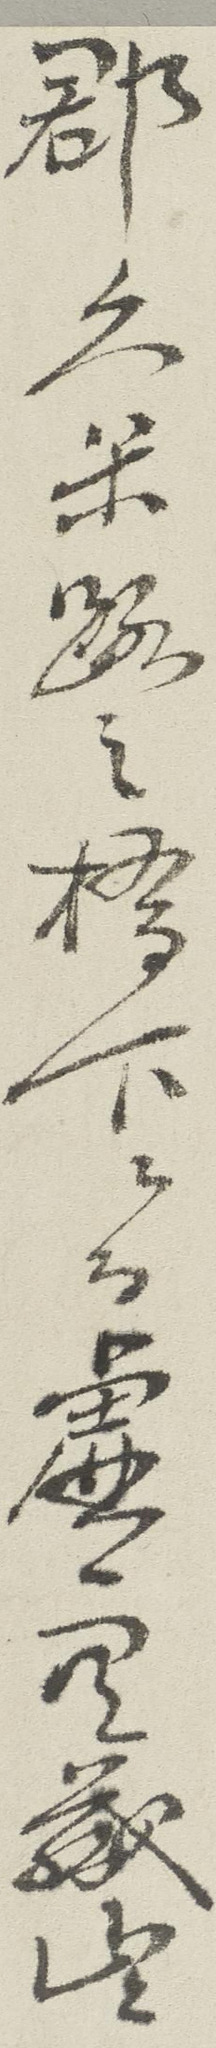郡久米路之橋下二而虚空蔵山と
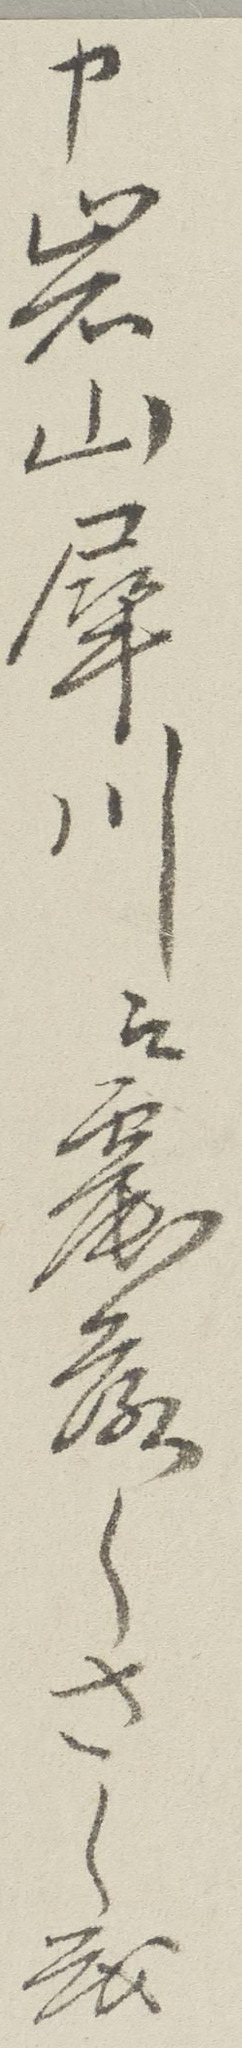申岩山犀川え震落候さしも
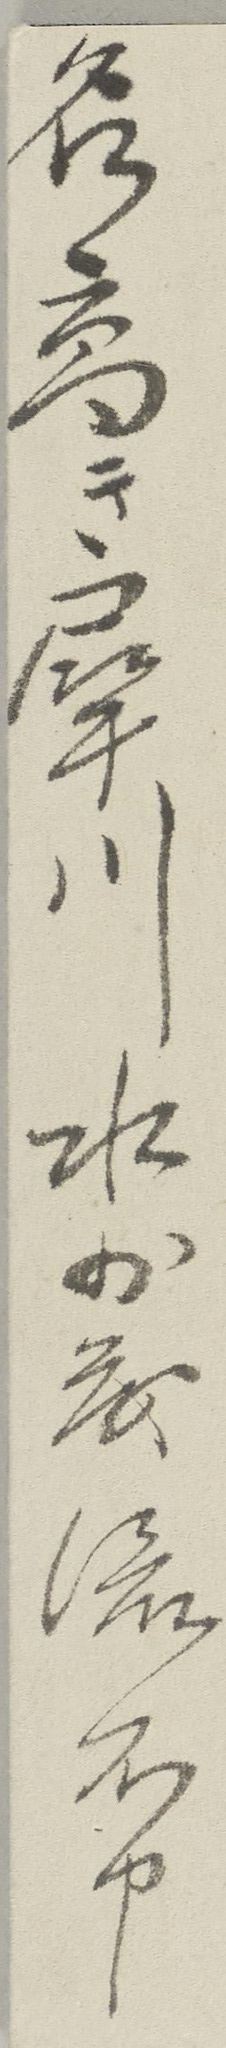名高き犀川水少も流不申

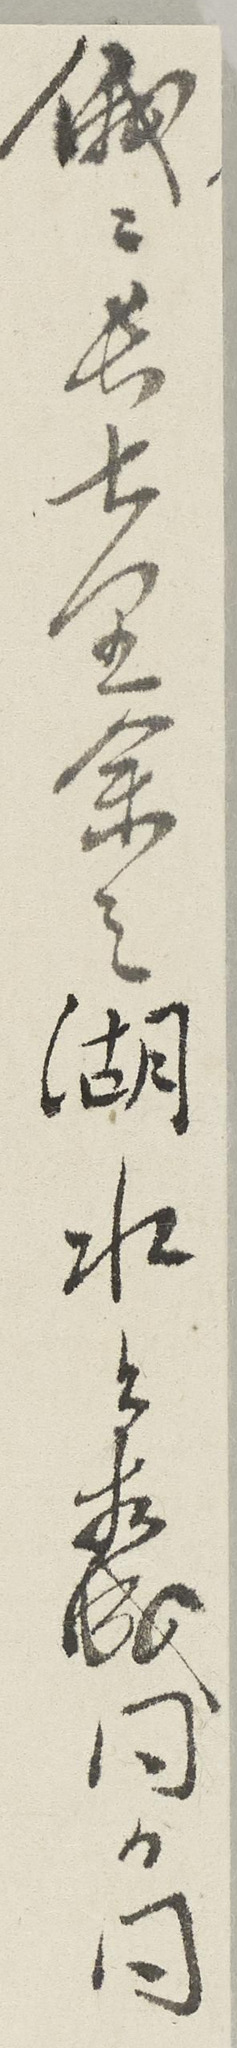俄ニ長七里余は湖水と相成同日同
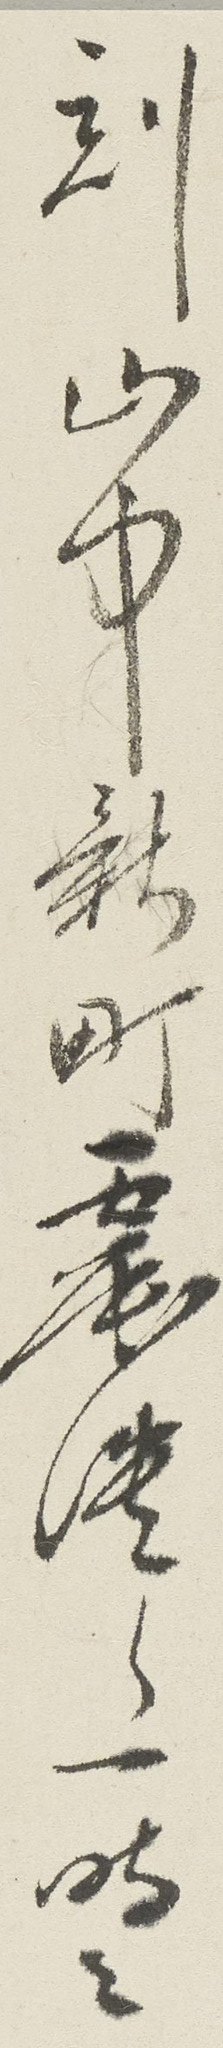刻山中新町震潰候一時ニ
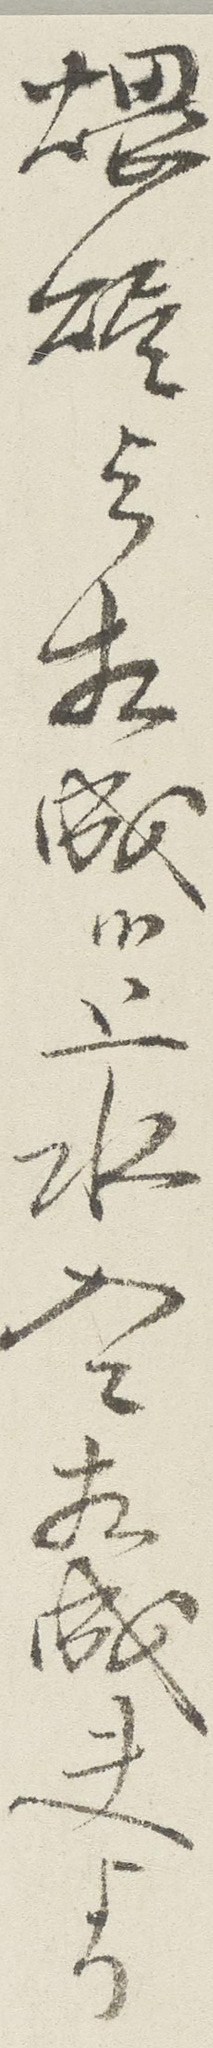煨燼と相成候上水入ニ相成夫より
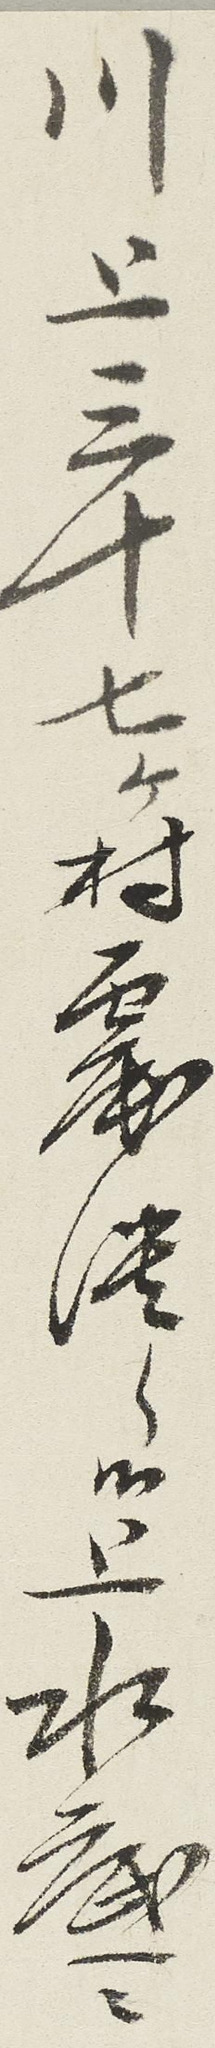川上三十七ケ村震潰候御上水底ニ
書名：[善光寺地震に関する書状]
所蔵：東京大学地震研究所図書室 Earthquake Research Institute Library, The University of Tokyo, JAPAN
